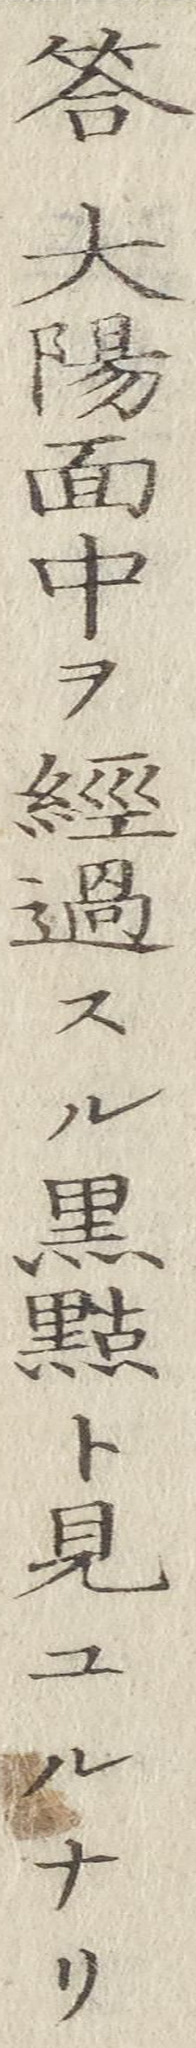答大陽面中ヲ経過スル黒点ト見ユルナリ
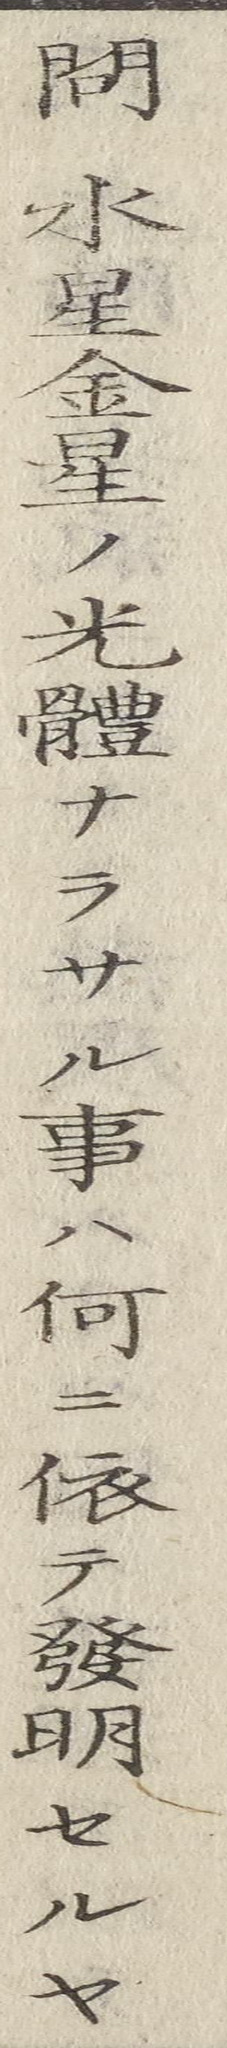問水星金星ノ光体ナラサル事ハ何ニ依テ発明セルヤ
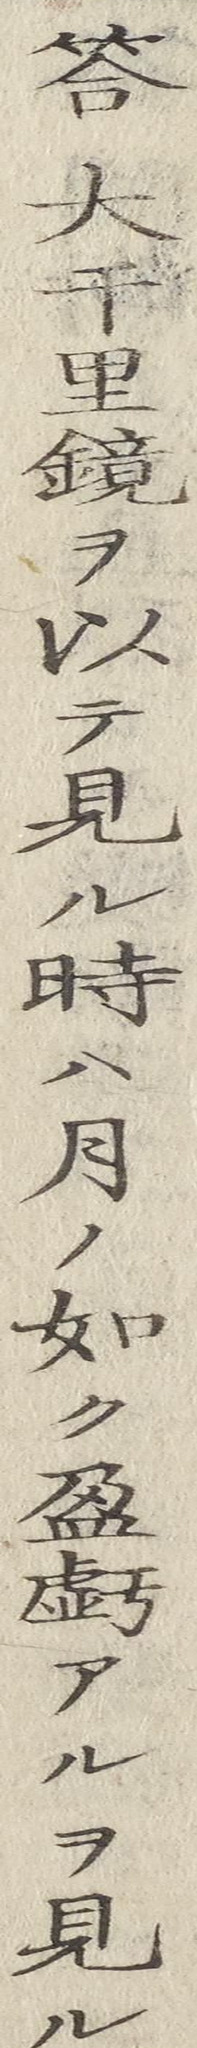答大千里鏡ヲ以テ見ル時ハ月ノ如ク盈虧アルヲ見ル
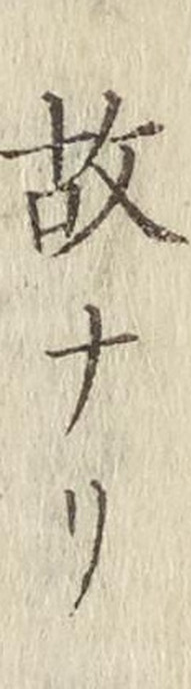故ナリ
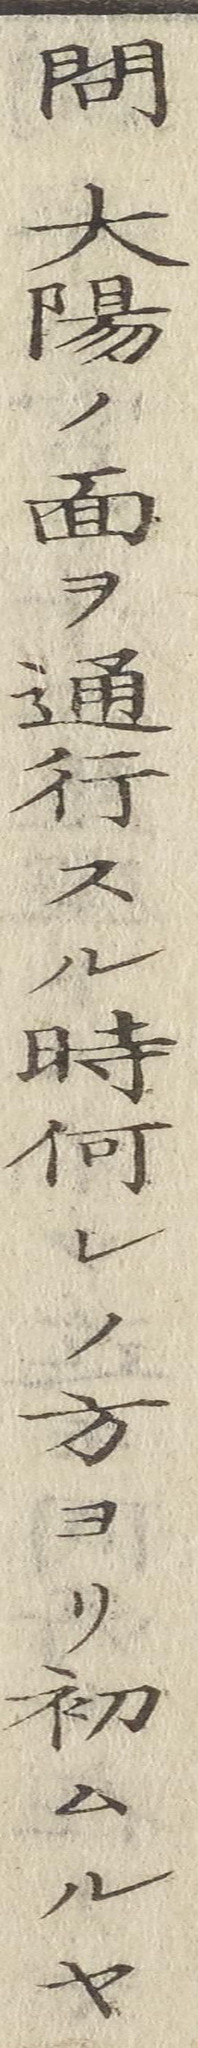問大陽ノ面ヲ通行スル時何レノ方ヨリ初ムルヤ
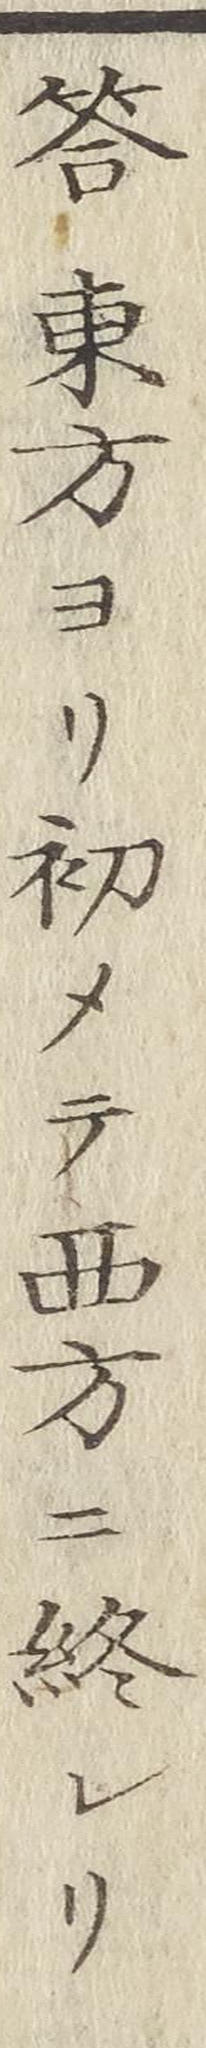答東方ヨリ初メテ西方ニ終レリ
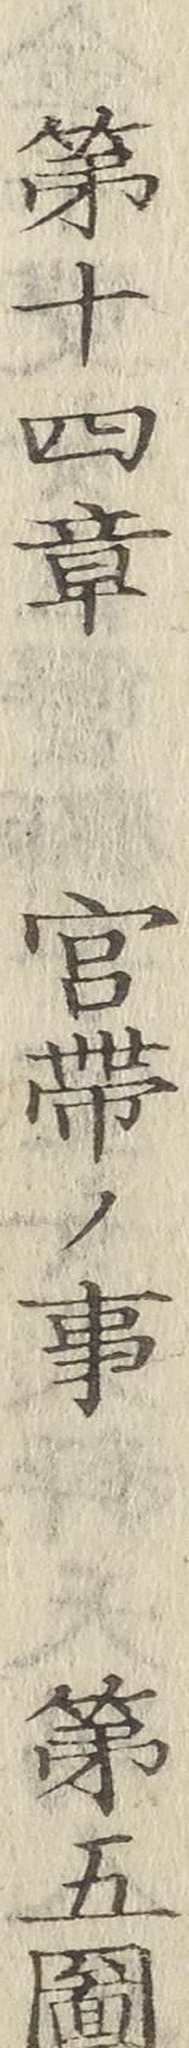第十四章宮帯ノ事第五図
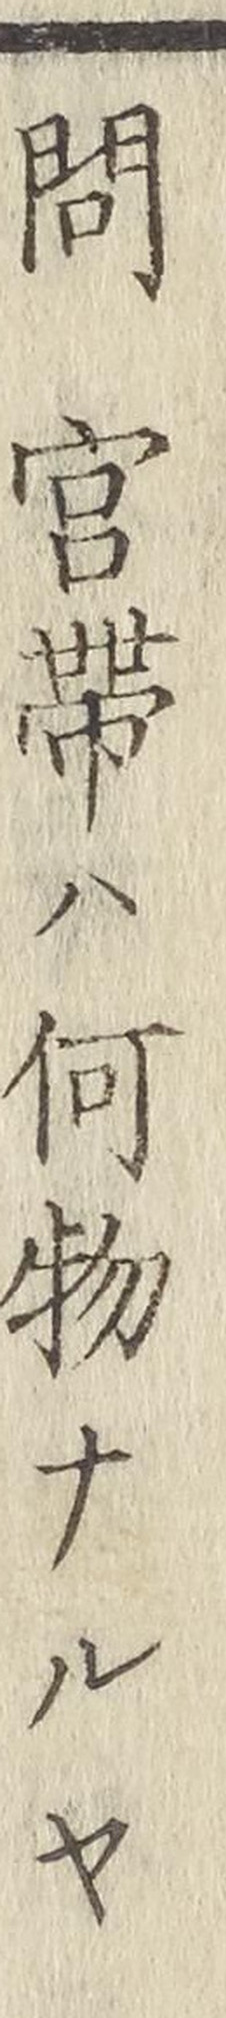問宮帯何物ナルヤ
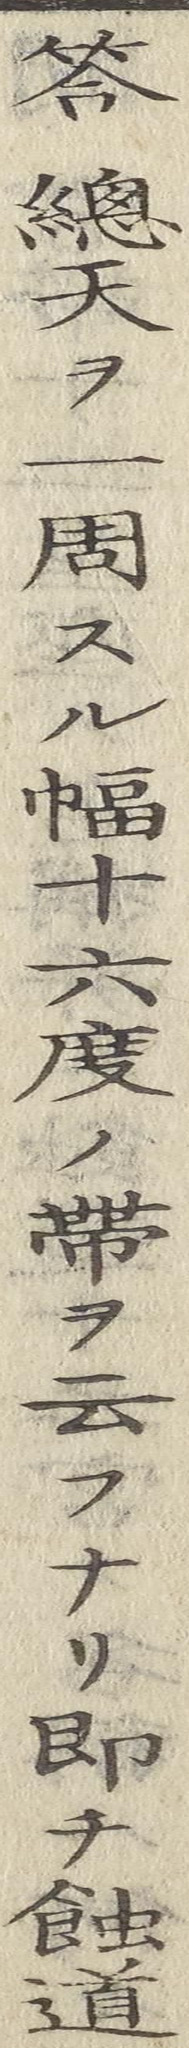答総天ヲ一周スル幅十六度ノ帯ヲ云フナリ即チ蝕道
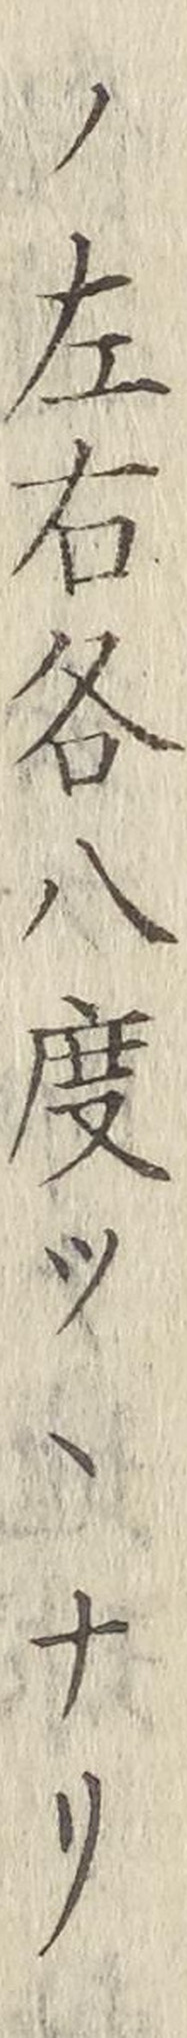ノ左右各八度ツヽナリ
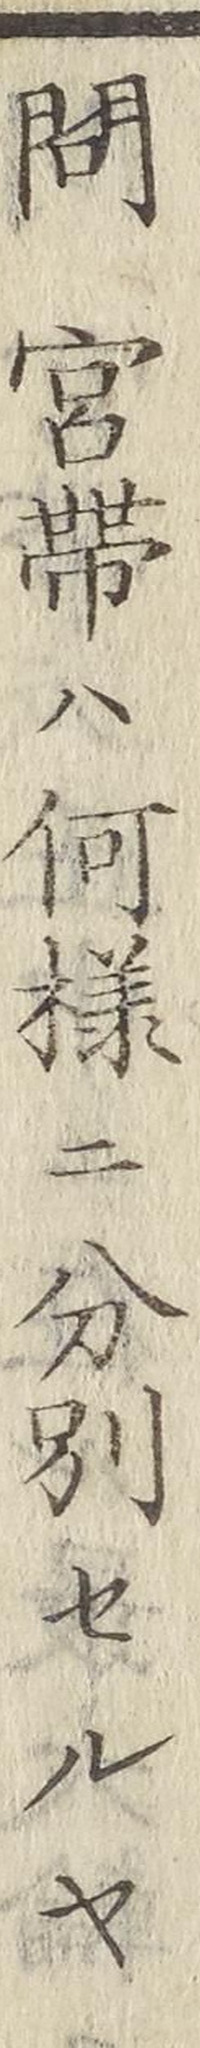問宮帯ハ何様ニ分別セルヤ
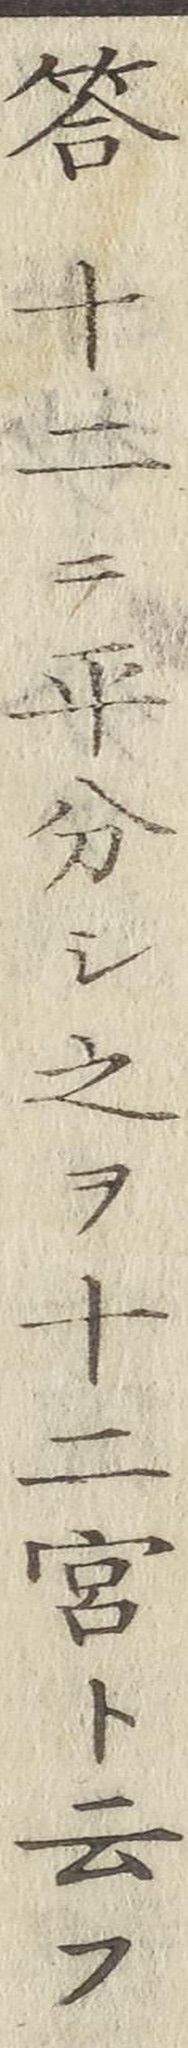答十二ニ平分シ之ヲ十二宮ト云フ
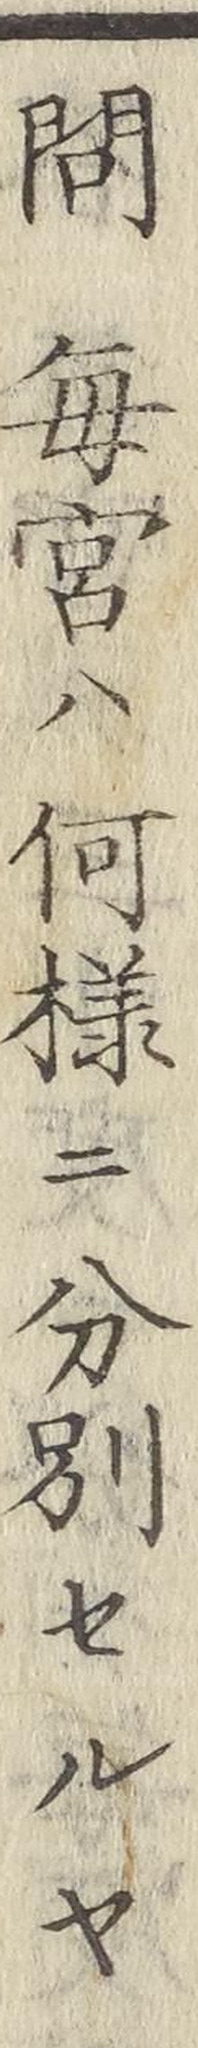問毎宮ハ何様ニ分別セルヤ

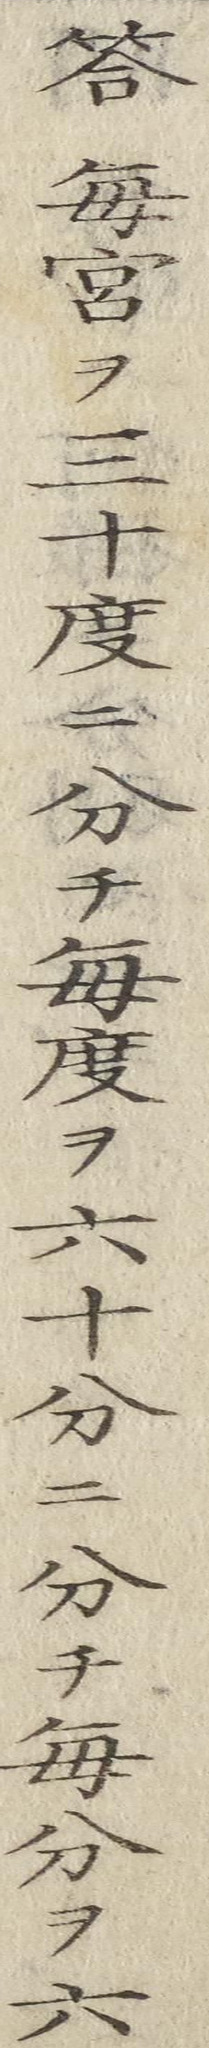答毎宮ヲ三十度ニ分チ毎度ヲ六十分ニ分チ毎分ヲ六
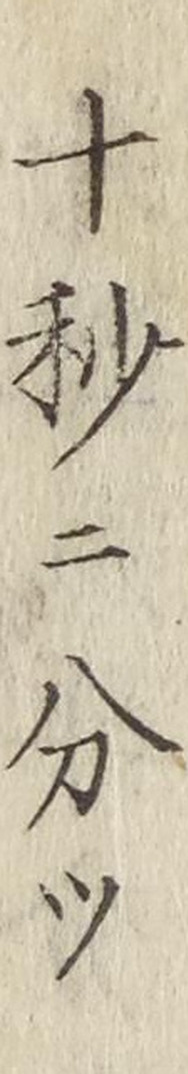十秒ニ分ツ
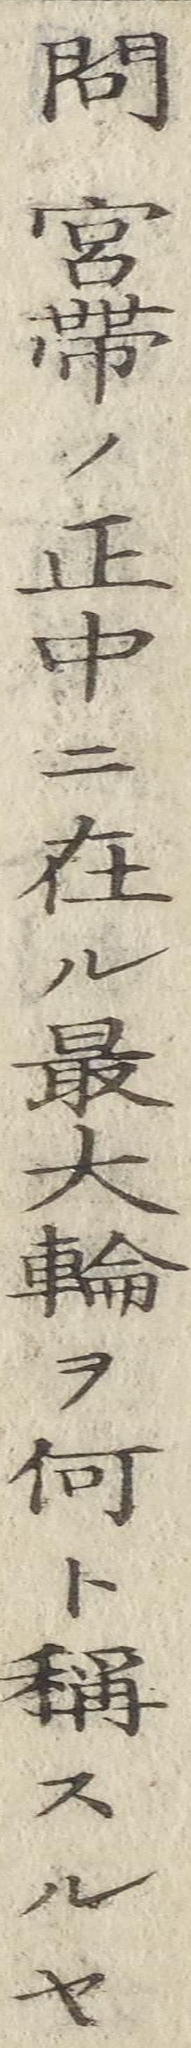問宮帯ノ正中ニ在ル最大輪ヲ何ト称スルヤ
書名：星学圖説　上
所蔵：東京大学地震研究所図書室 Earthquake Research Institute Library, The University of Tokyo, JAPAN
